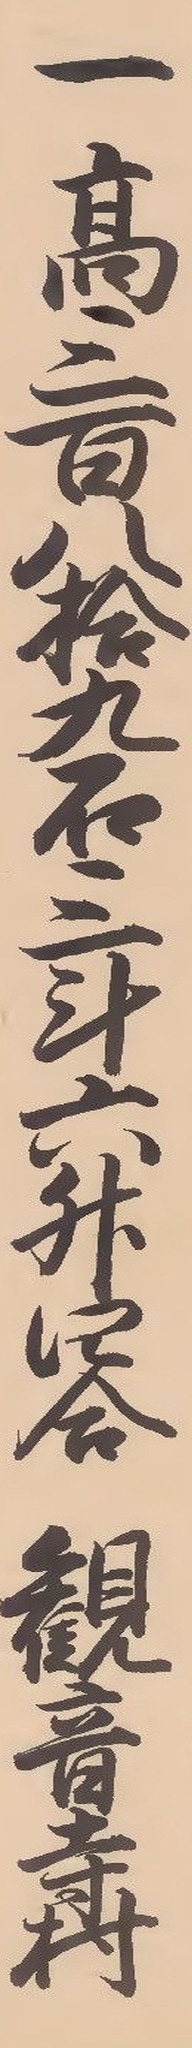一髙三百八拾九石三斗六升四合観音寺村
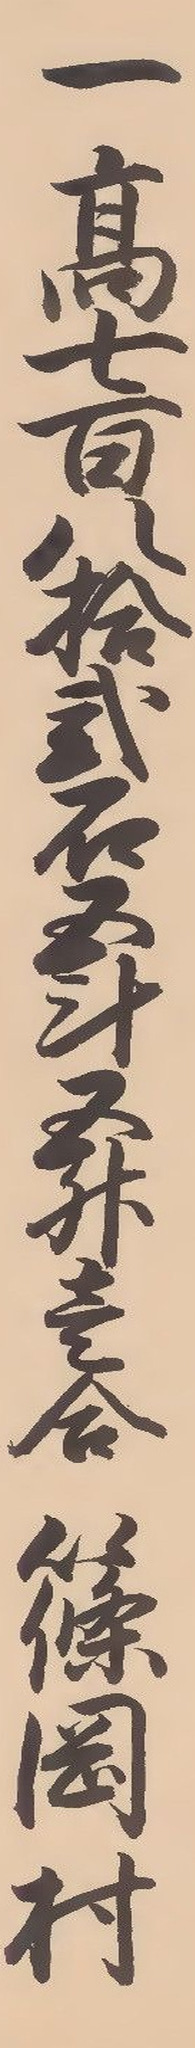一髙七百八拾弐石五斗五升壱合篠岡村
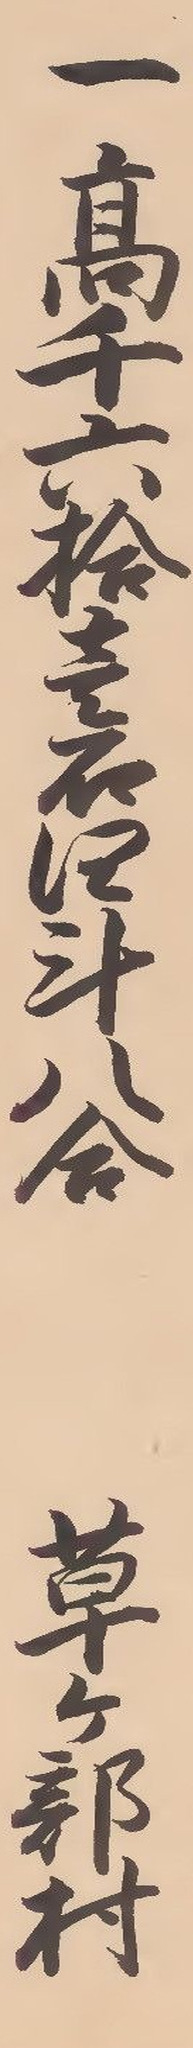一髙千六拾壱石四斗八合草ケ部村
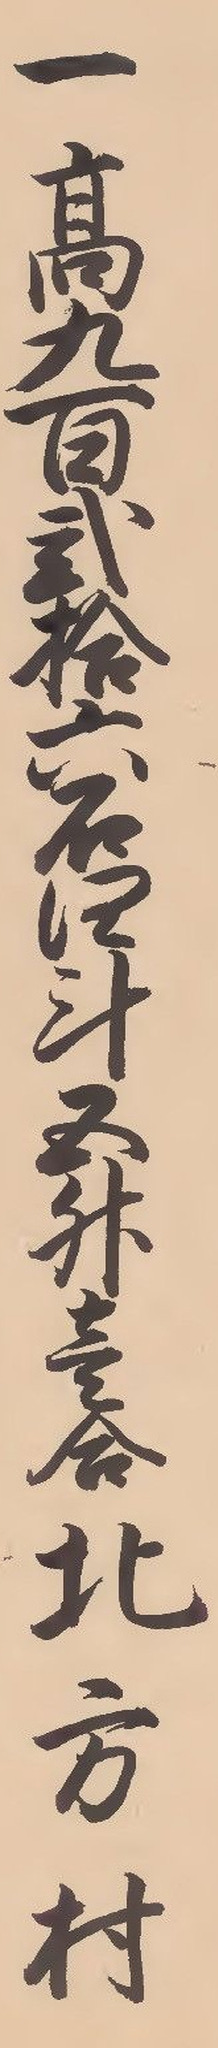一髙九百弐拾六石四斗五升壱合北方村
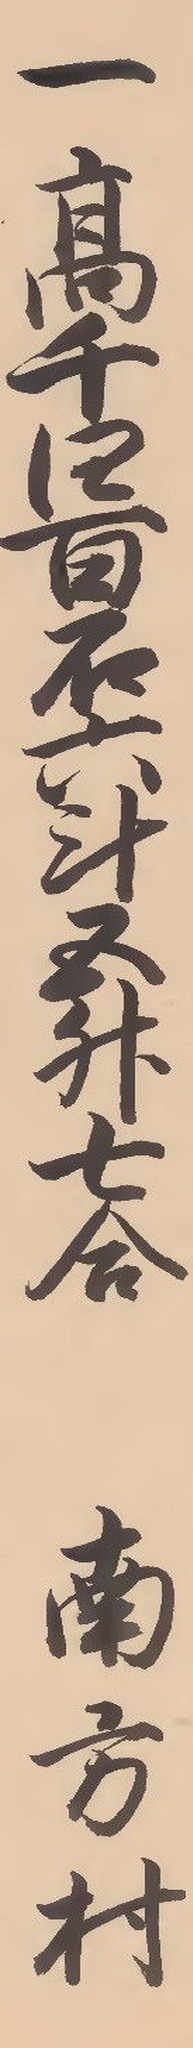一髙千四百石六斗五升七合南方村
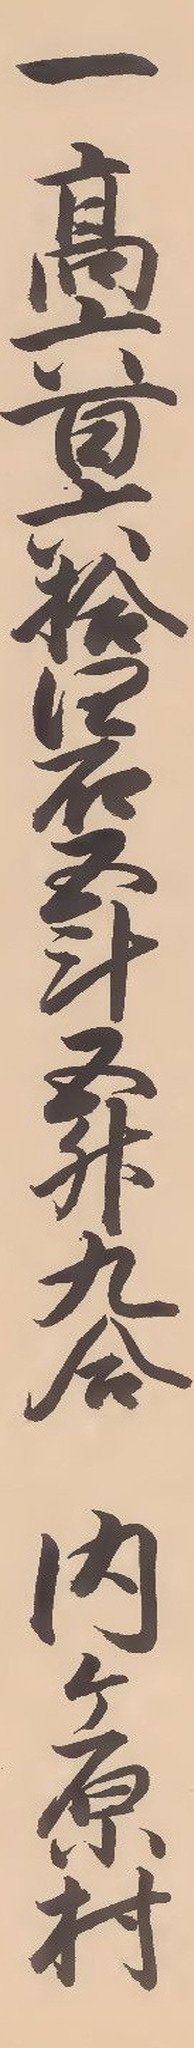一髙六百六拾四石五斗五升九合内ケ原村
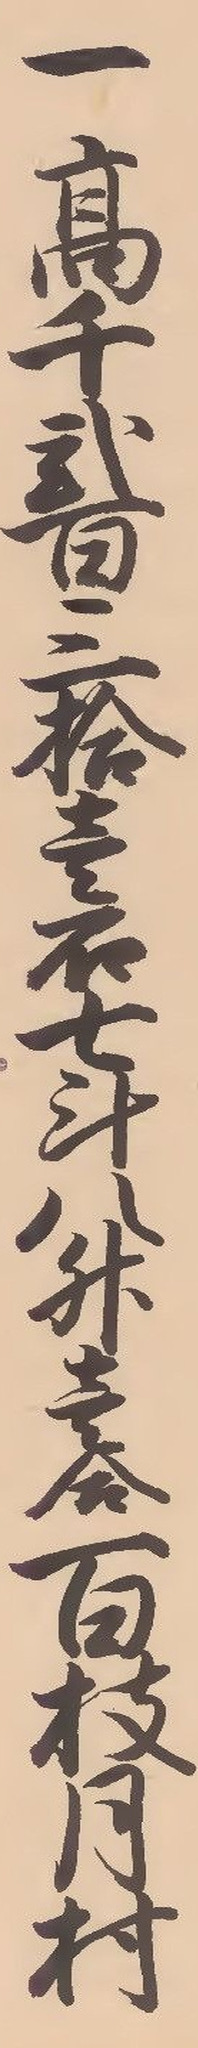一髙千弐百三拾壱石七斗八升壱合百枝月村

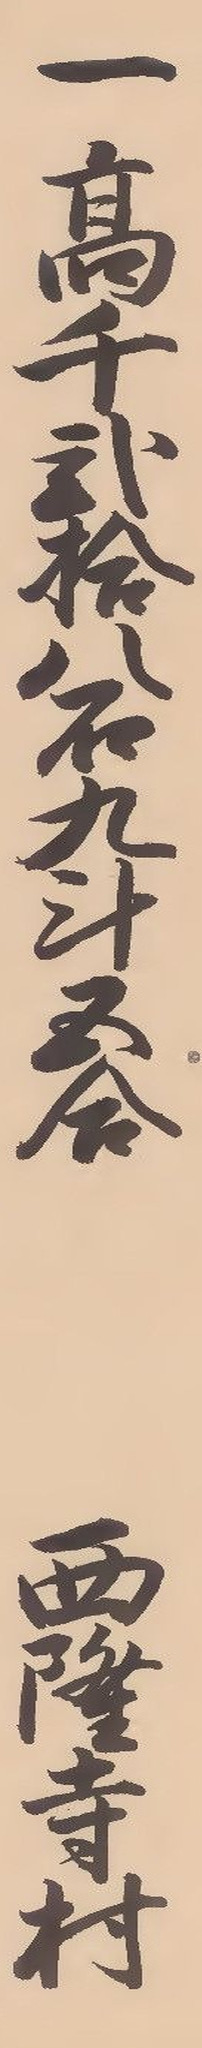一髙千弐拾八石九斗五合西隆寺村
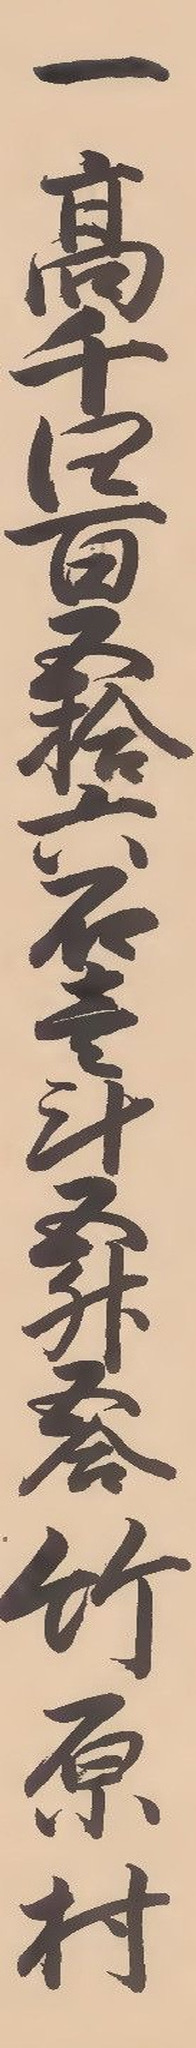一髙千四百五拾六石壱斗五升五合竹原村
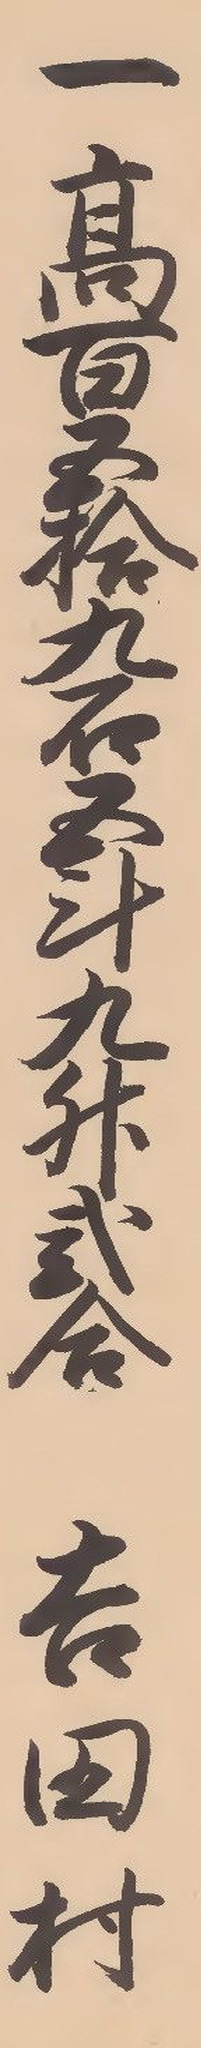一髙百五拾九石五斗九升弐合吉田村
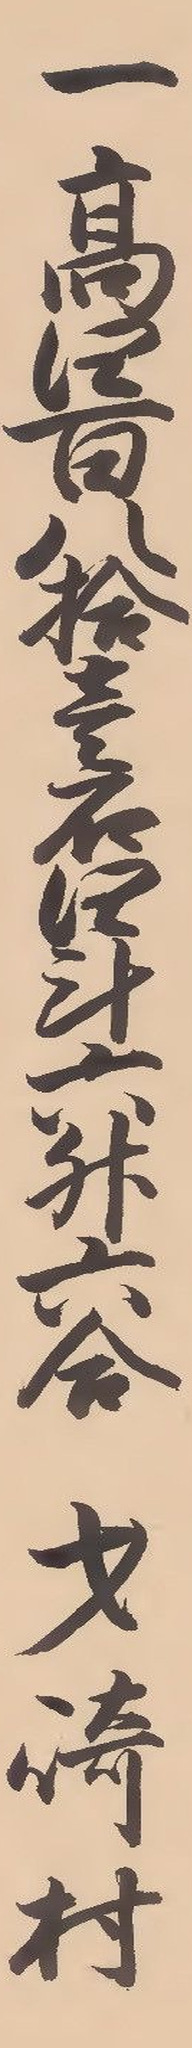一髙四百八拾壱石四斗六升六合才崎村
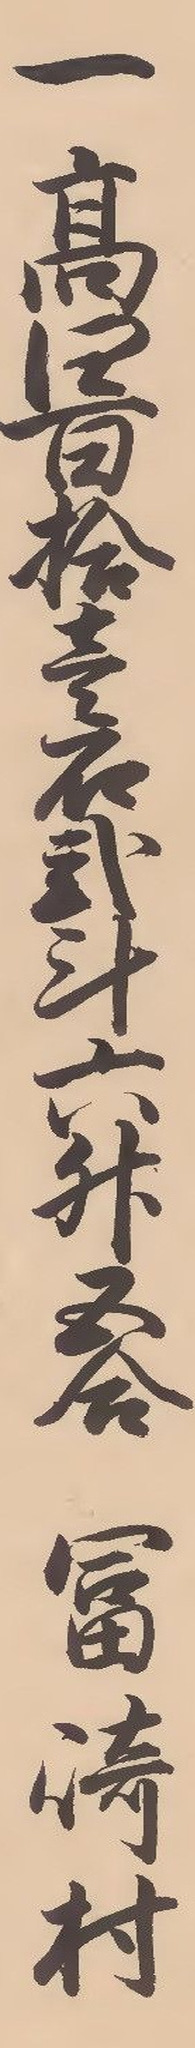一髙四百拾壱石弐斗六升五合冨崎村
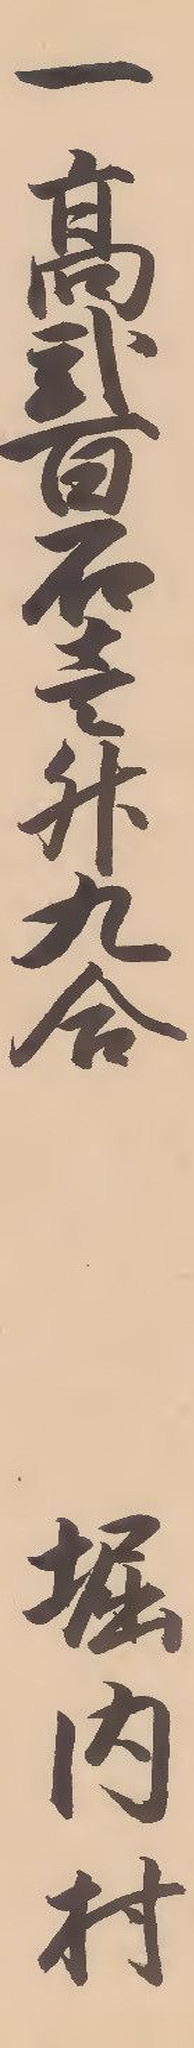一髙弐百石壱升九合堀内村
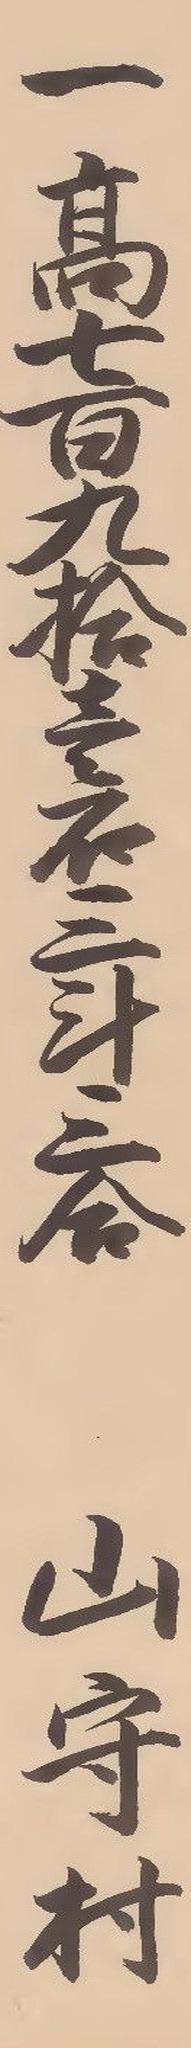一髙七百九拾壱石三斗三合山守村
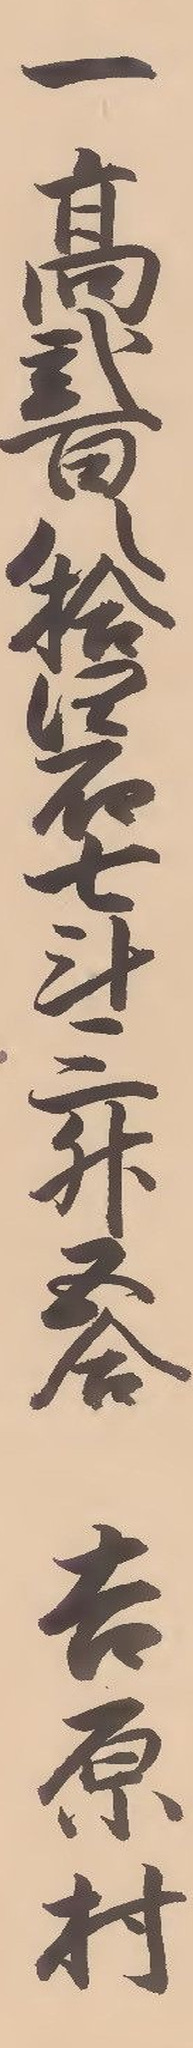一髙弐百八拾四石七斗三升五合吉原村

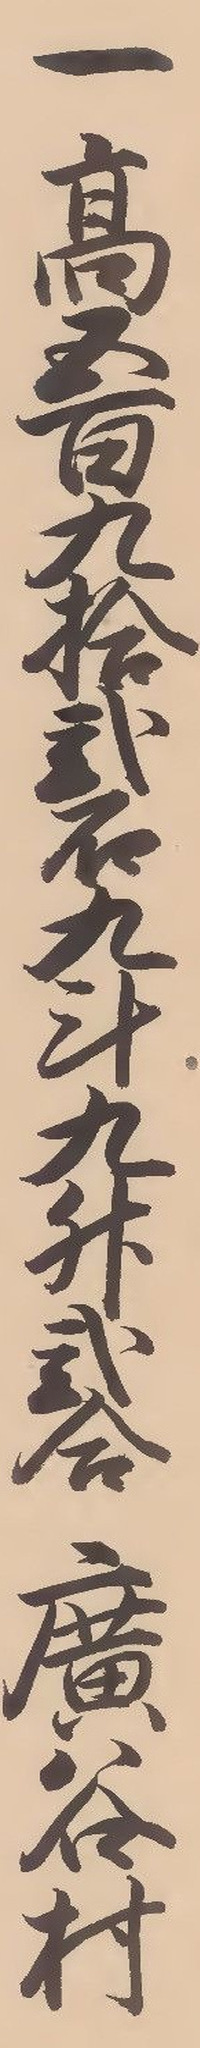一髙五百九拾弐石九斗九升弐合廣谷村
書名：備前国郷帳
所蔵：国立公文書館 National Archives of Japan
